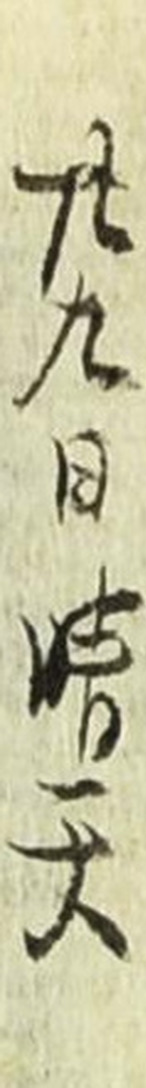廿一日晴天
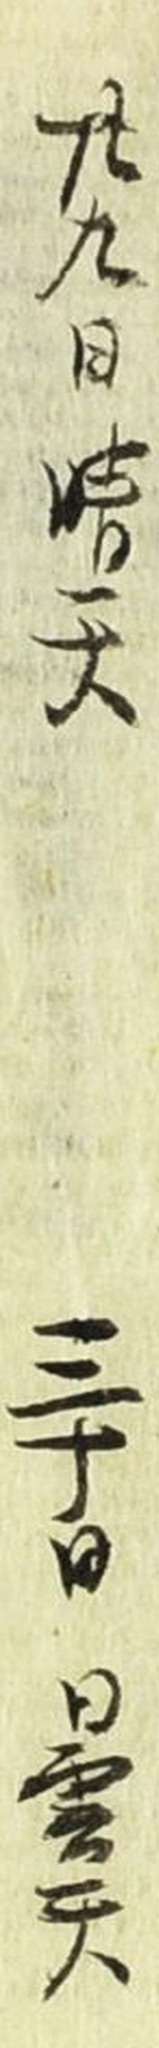廿九日晴天三十日曇天
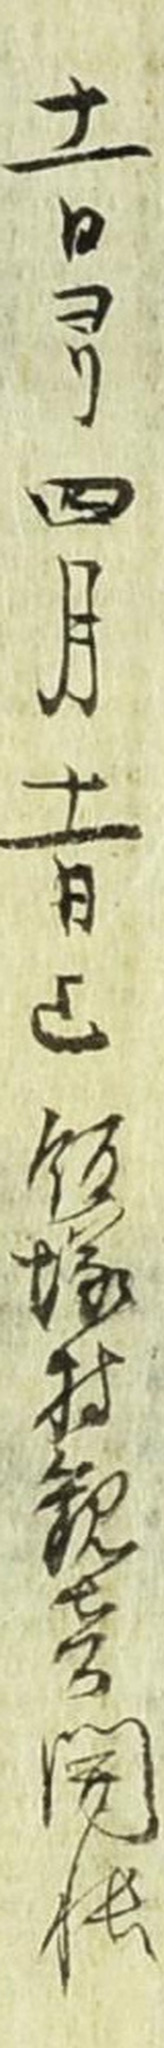十一日より四月十一日迄飯塚村観音開帳
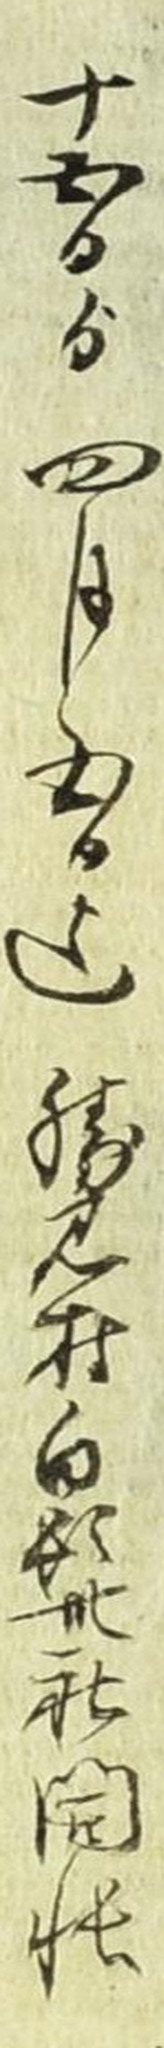十五日より四月五日迄勝見村白髭社開帳

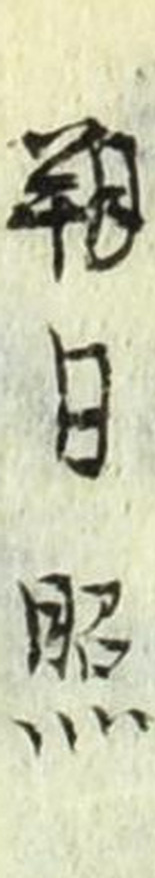九日照
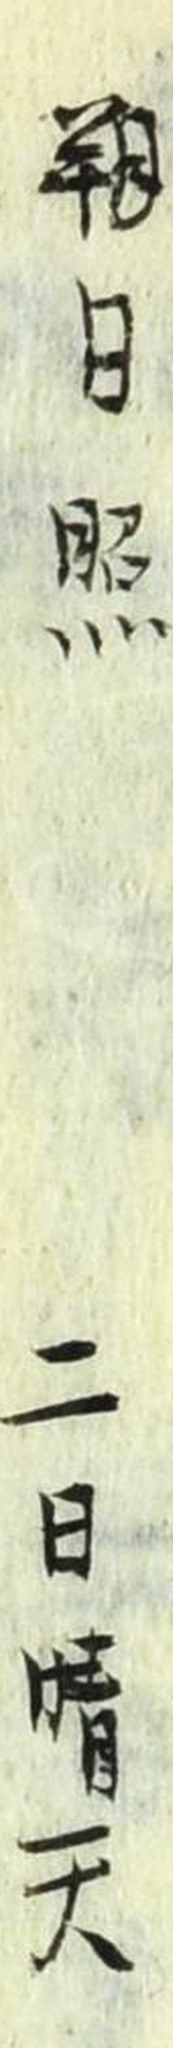朔日照二日晴天
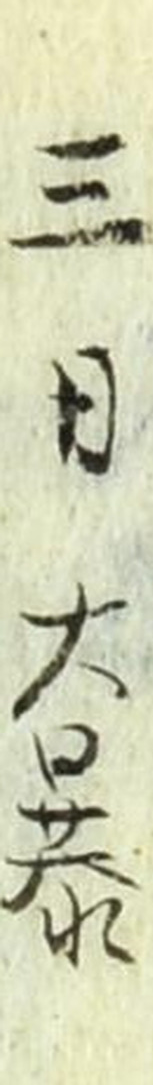三日大暴
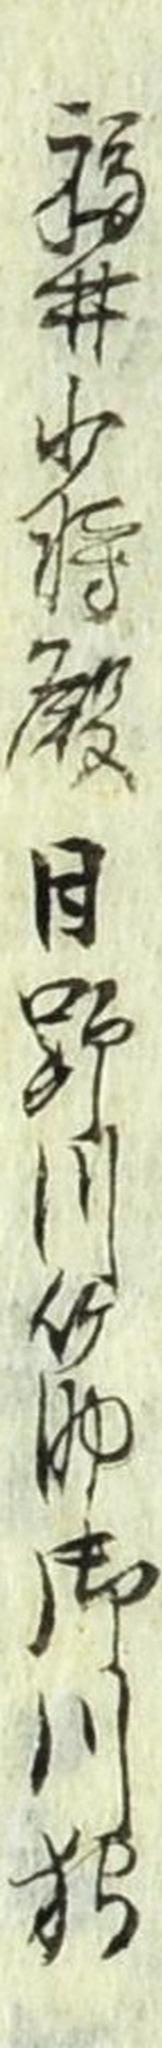福井少将殿日野川筋御川狩
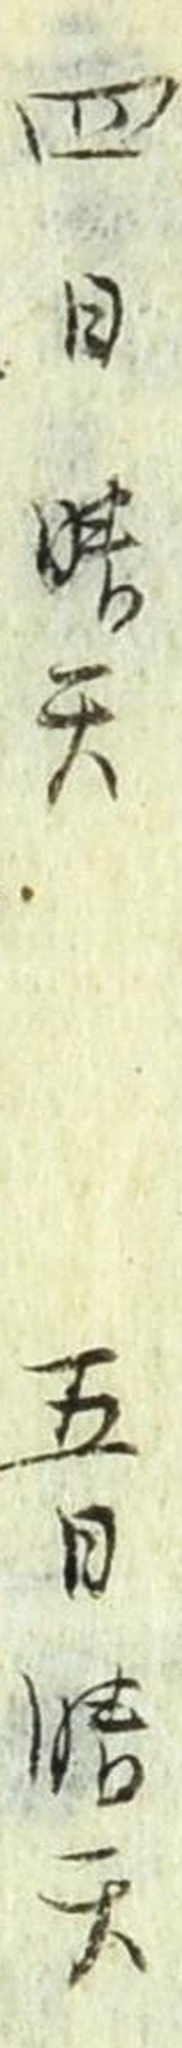四日晴天五日晴天
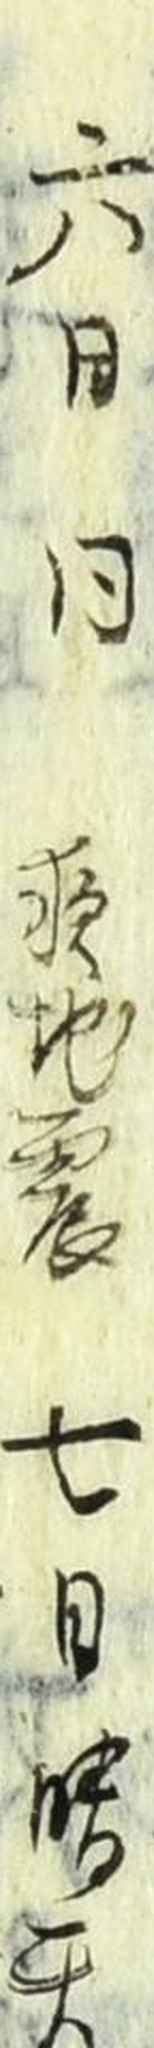六日同夜地震七日晴天
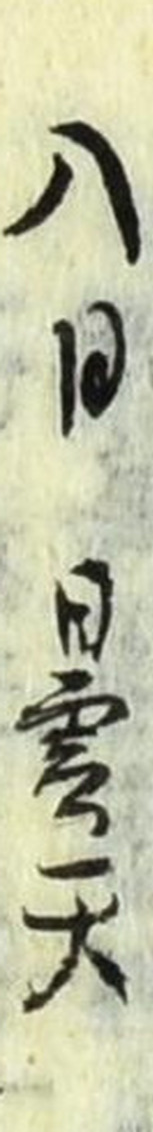八日曇天
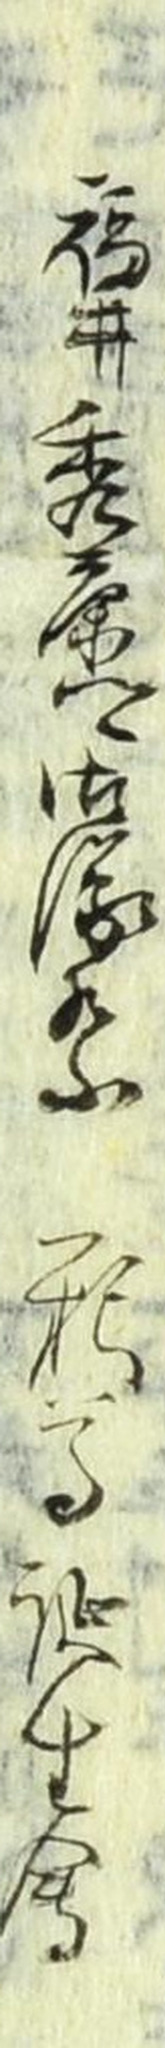福井秀康卿御像祭釈尊誕生会
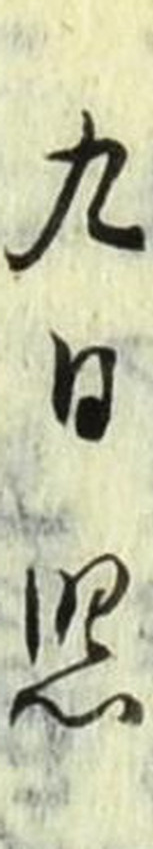九日照
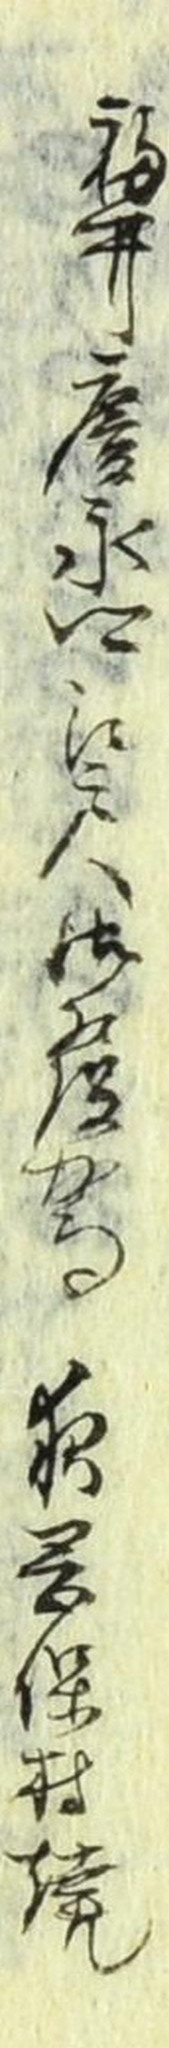福井慶永卿江戸へ御発駕夜岡保村焼
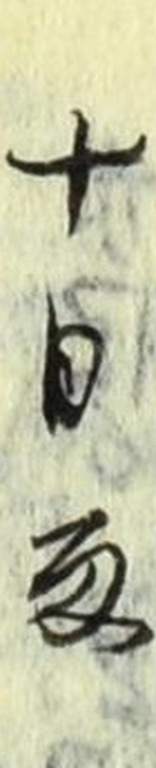十日雨
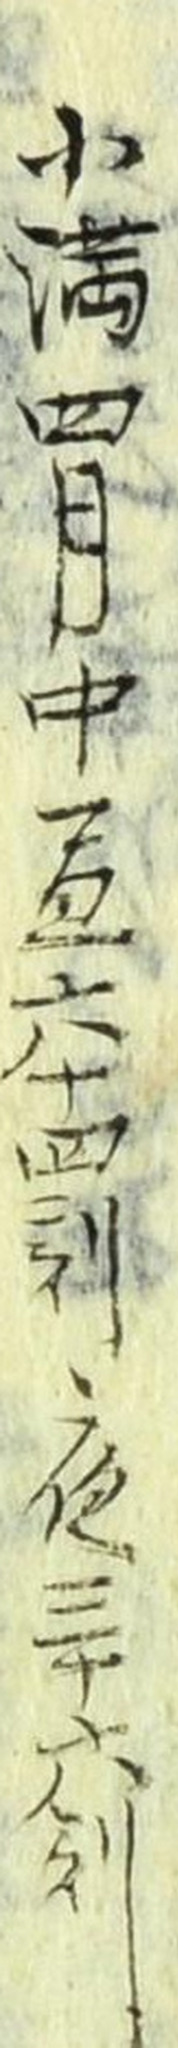小満四月中昼六十四刻夜三十六刻
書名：（日記）
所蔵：福井県文書館 Fukui Prefectural Archives
